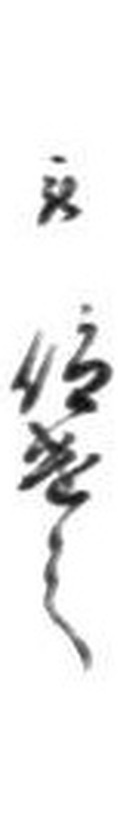被仰遣之
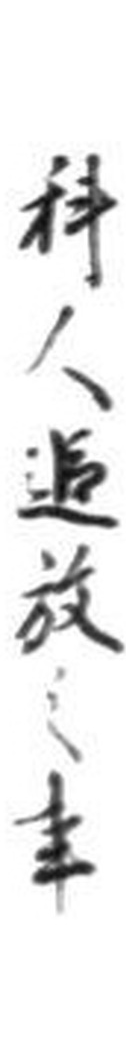科人追放之事

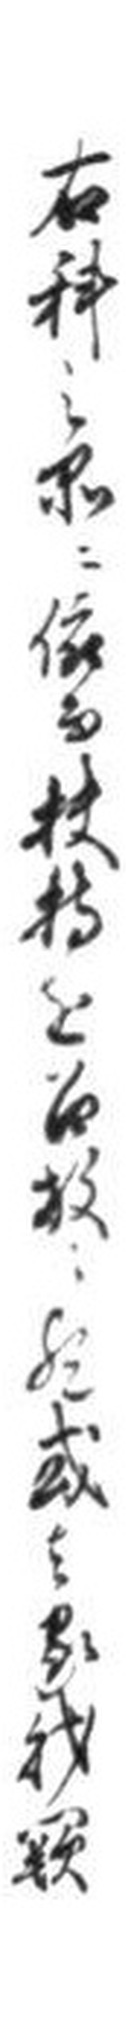右科之品ニ依而扶持を召放候歟或者家財闕
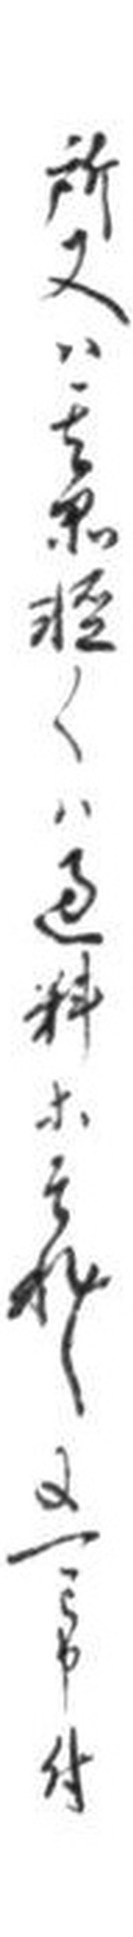所又ハ其品軽くハ過料等それ〳〵に可被申付
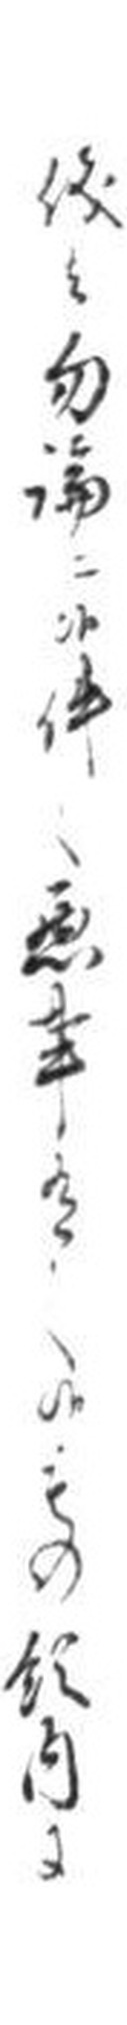儀者勿論ニ候件之悪事有之候もの領内に
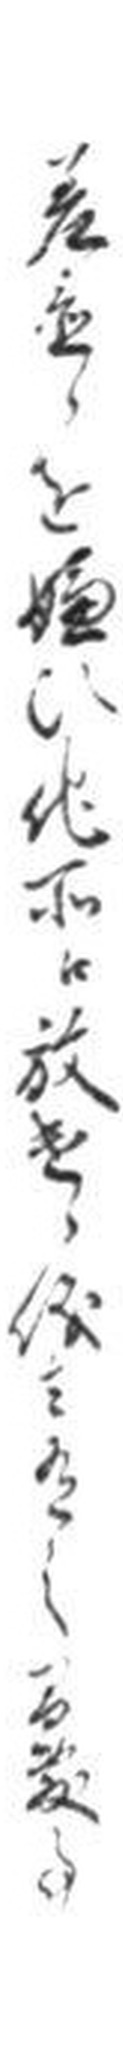差置候を嫌ひ他所江放遣候儀者有之間敷事
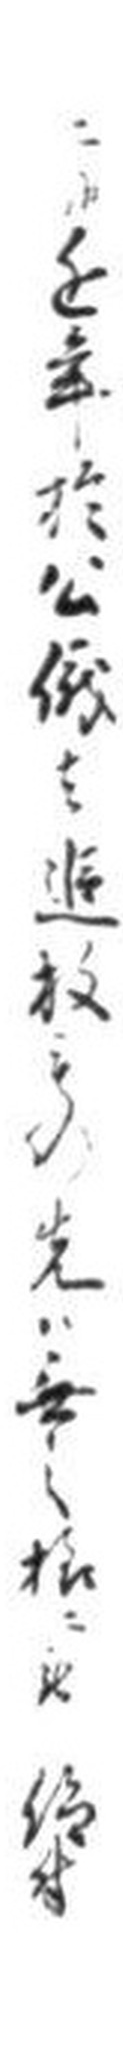ニ候近年於公儀者追放もの先ハ無之様ニ被仰付
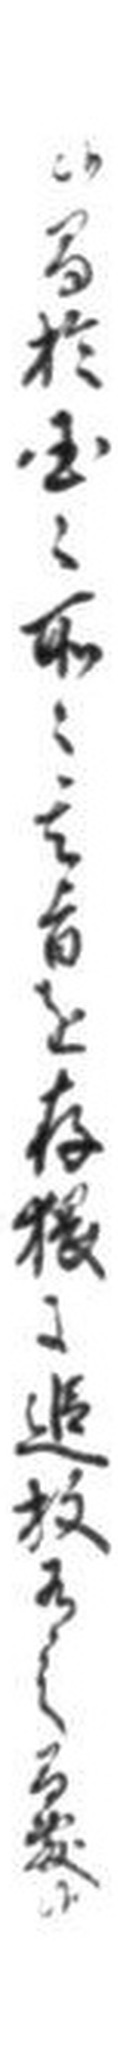候間於国々所々其旨を存猥に追放有之間敷候
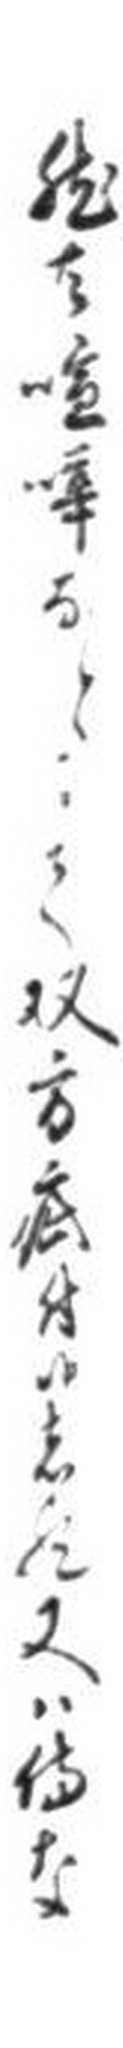然共喧嘩なとにて双方疵付候者歟又ハ侍な
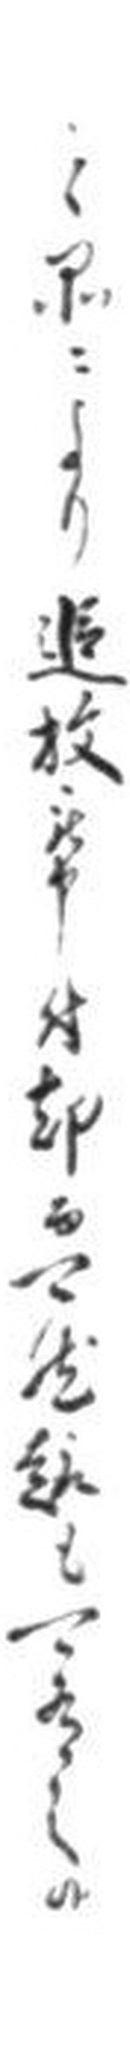と品ニより追放被申付却而可然趣も可有之候
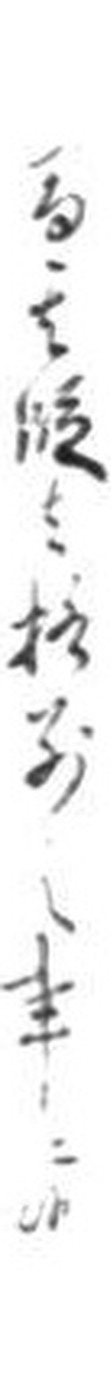間其段者格別之事ニ候
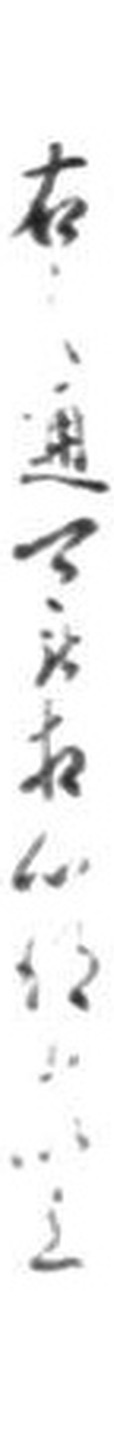右之通可被相心得候以上
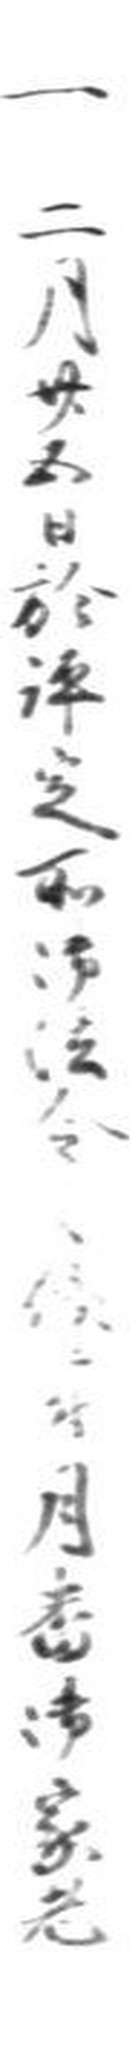一二月廿五日於評定所御法令之儀ニ付月番御家老
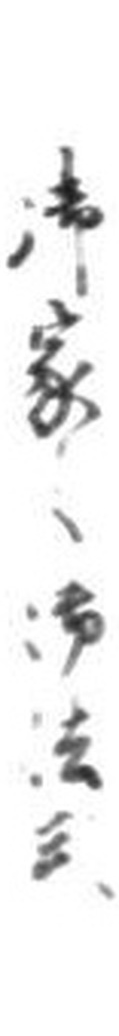御家之御法式
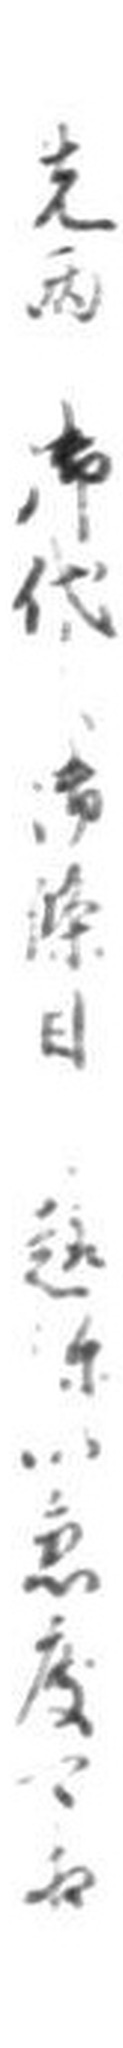先両御代御条目之趣弥以急度可相
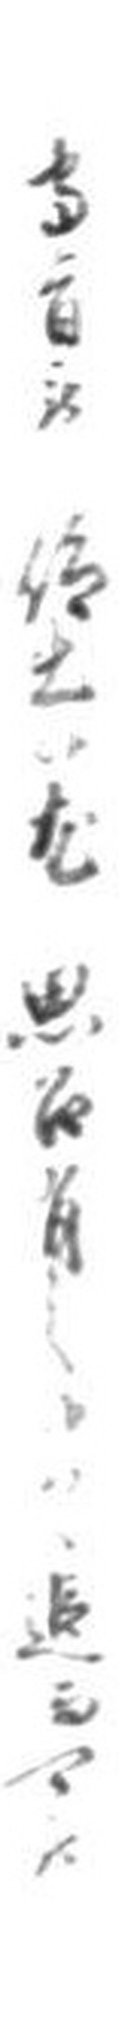守旨被仰出候尤思召有之候ハヽ追而可被
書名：家譜 三十五 宗昌公 従享保六年到同七年
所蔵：福井県文書館 Fukui Prefectural Archives
